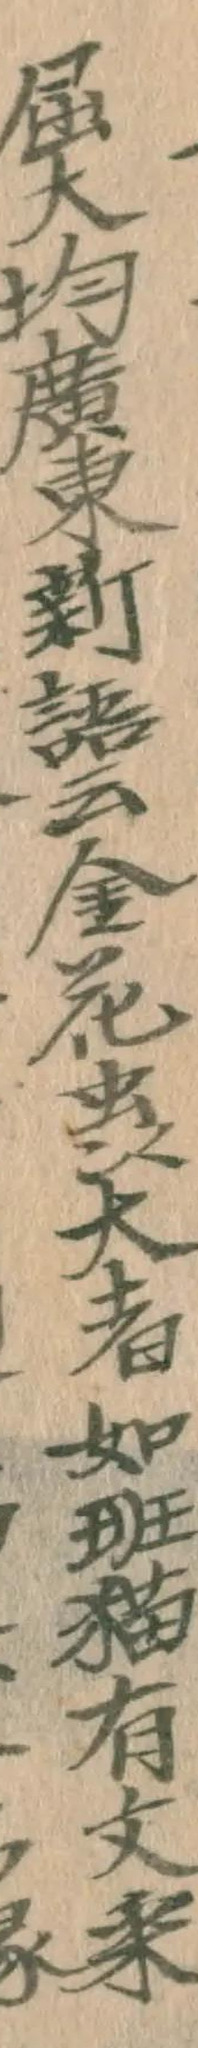屈大均廣東新語云金花蟲大者如班猫有文采
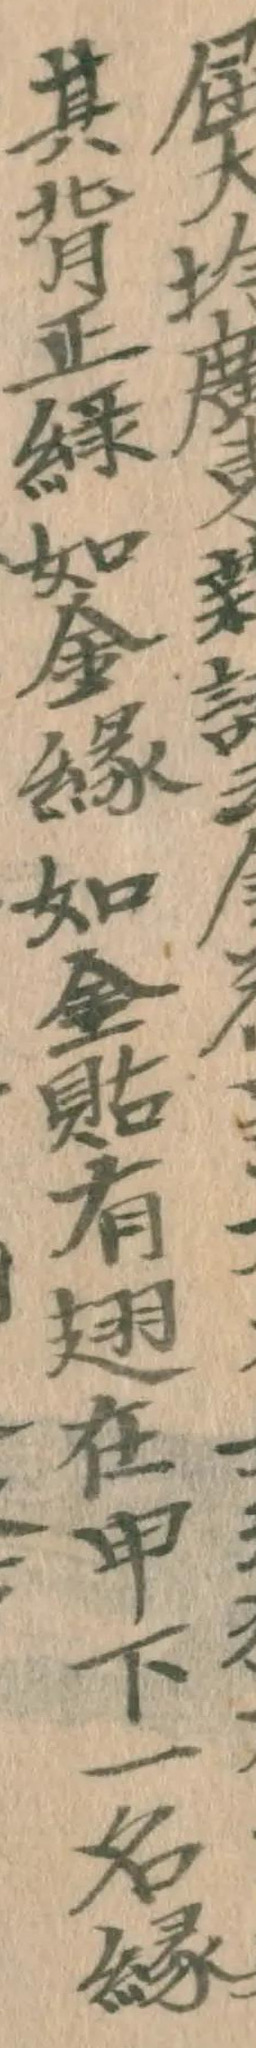其背正緑如金縁如金貼有翅在甲下一名緑
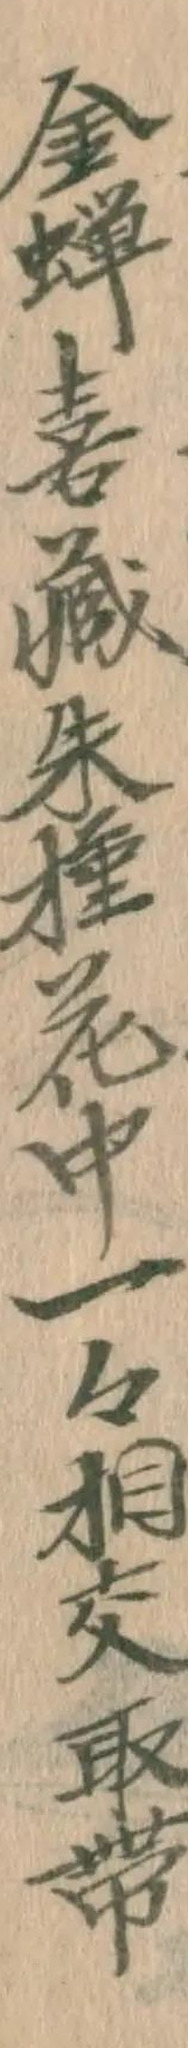金蝉喜藏朱種花中一々相交取帯
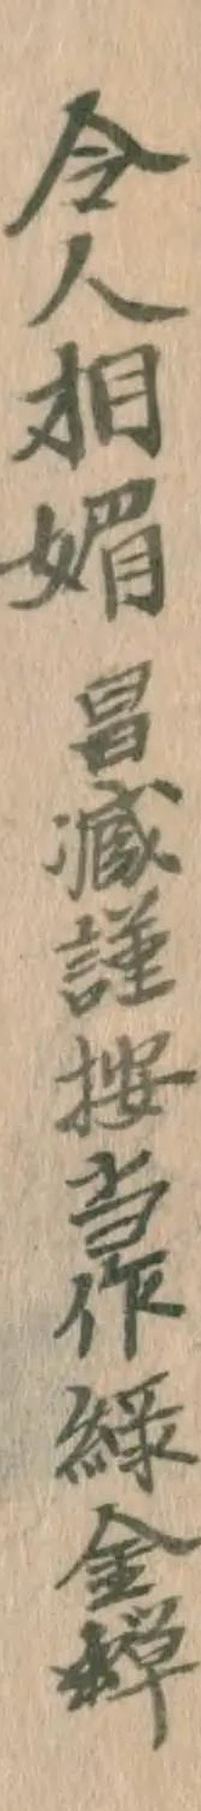令人相媚昌臧謹按当作緑金蝉
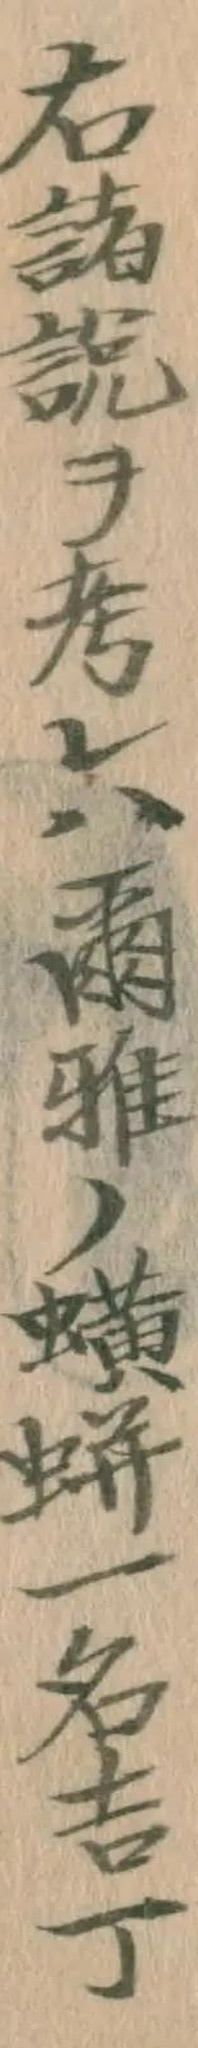右諸説ヲ考レハ爾雅ノ蟥蛢一名吉丁
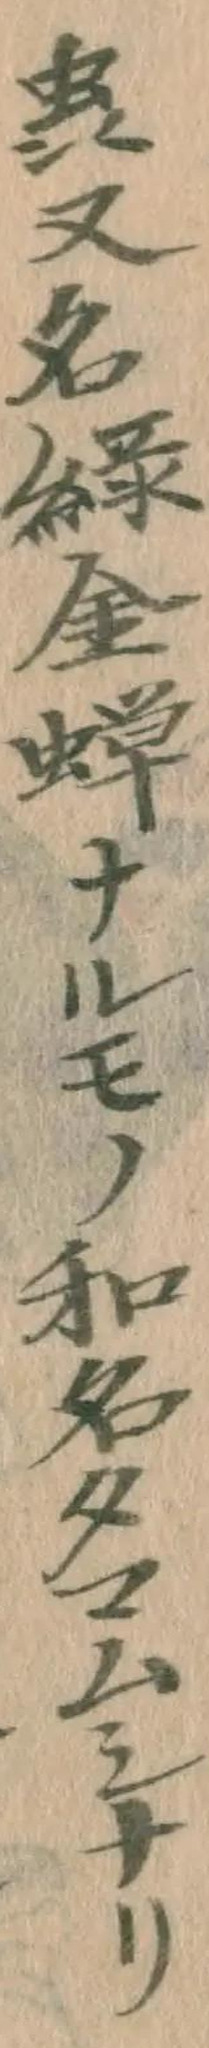蟲又名緑金蝉ナルモノ和名タマムシナリ
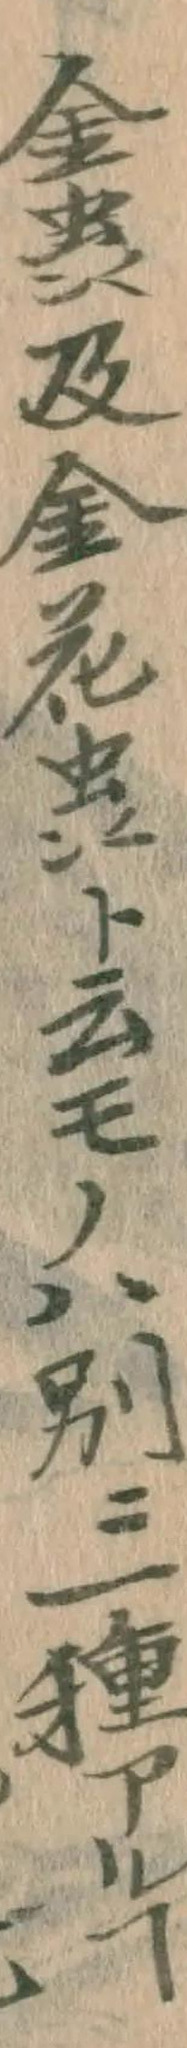金蟲及金花蟲ト云モノハ別ニ一種アルコト
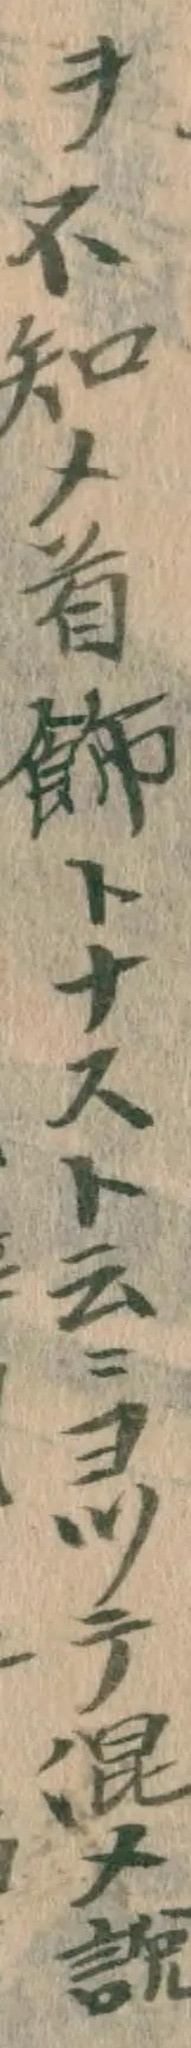ヲ不知シテ首飾トナスト云ニヨツテ混シテ説
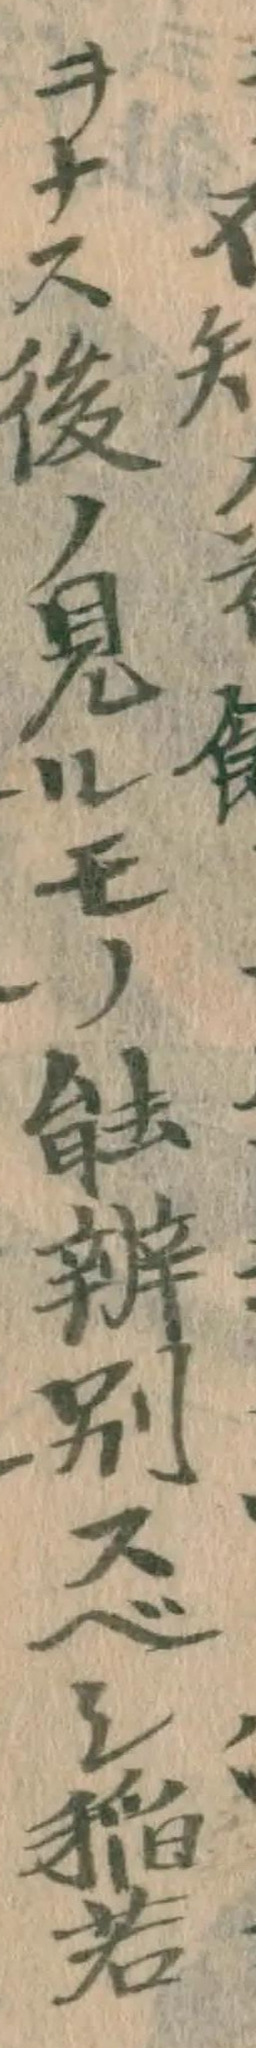ヲナス後ノ見ルモノ能辨別スベシ稲若
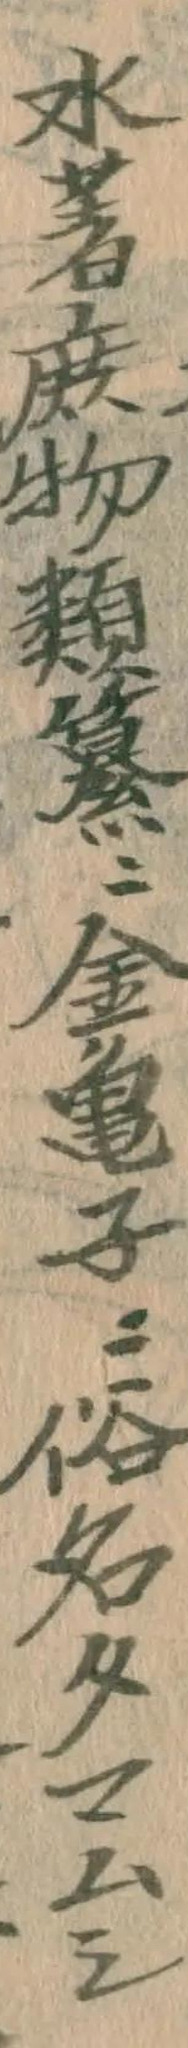水著庶物類纂ニ金亀子ニ俗名タマムシ
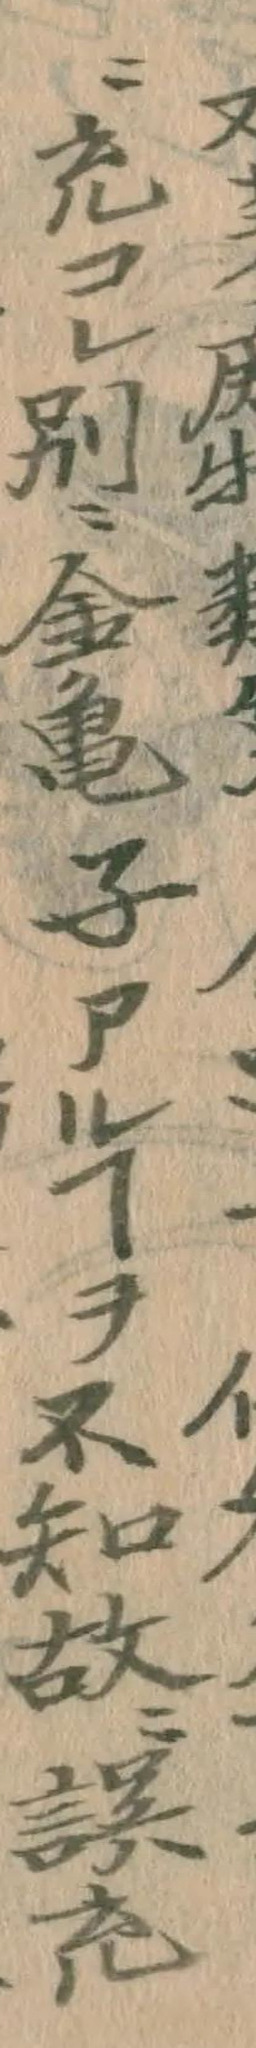ニ充コレ別ニ金亀子アルコトヲ不知故ニ誤充
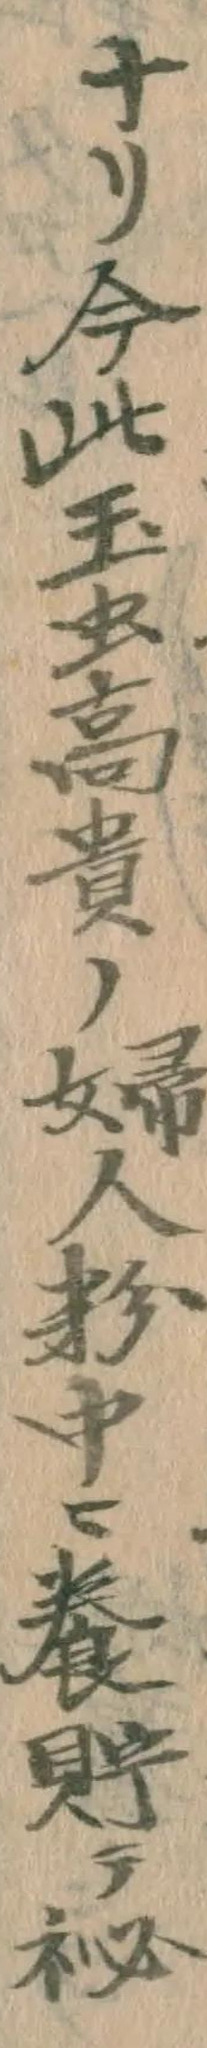ナリ今此玉虫高貴ノ婦人粉中ニ養貯テ秘
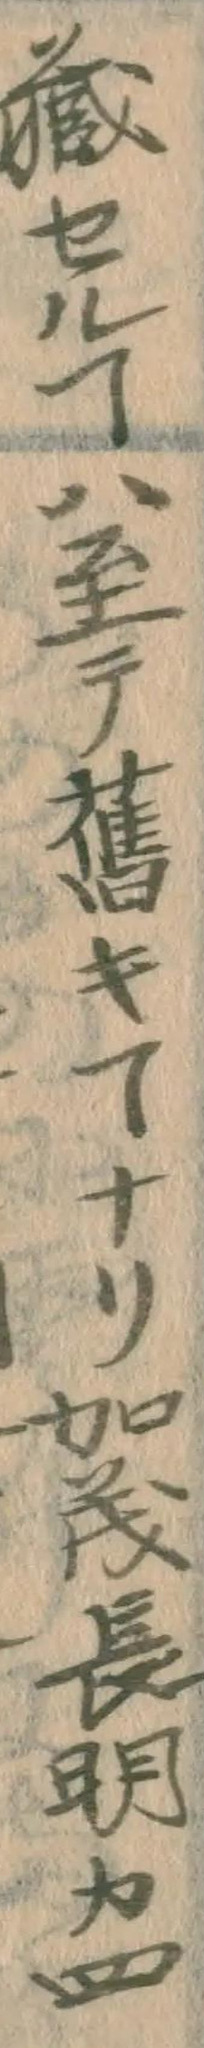藏セルコトハ至テ舊キコトナリ加茂長明カ四
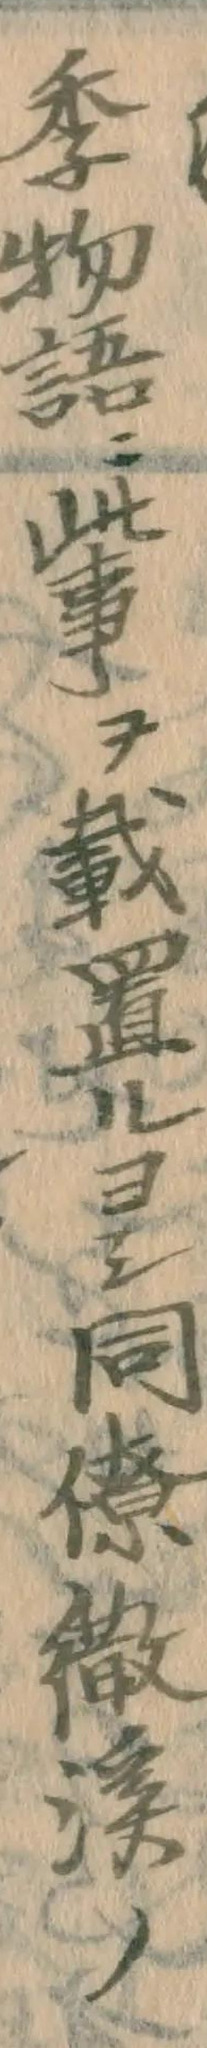季物語ニ此事ヲ載置ルヨシ同僚繖渓ノ
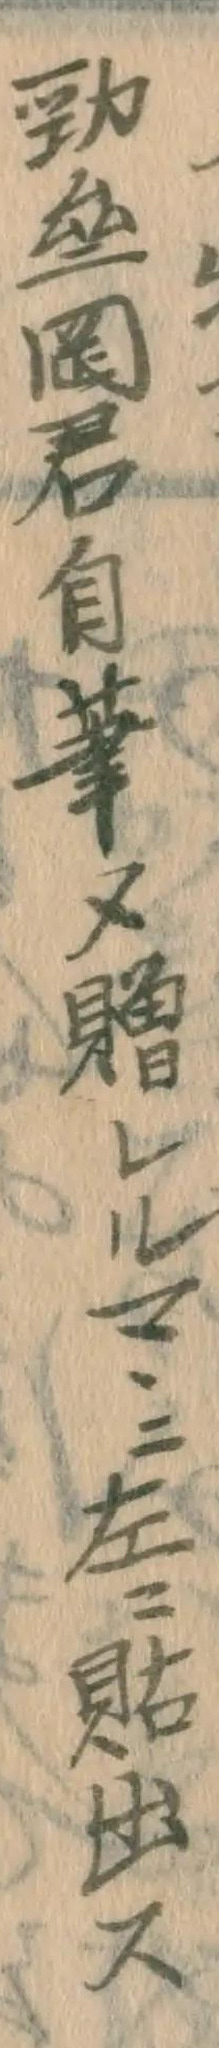勁亝岡君自筆シテ贈レルマヽニ左ニ貼出ス
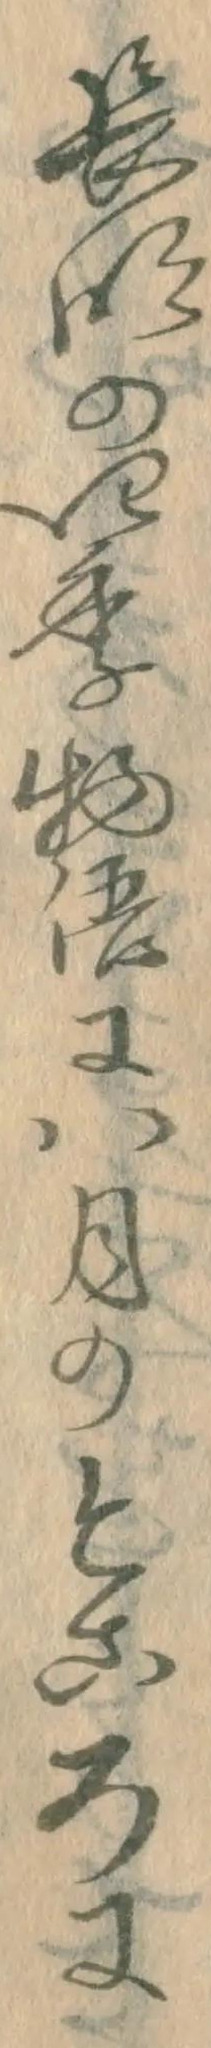長明の四季物語に八月のところに
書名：千蟲譜 3巻. [1]
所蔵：国立国会図書館 National Diet Library, JAPAN
